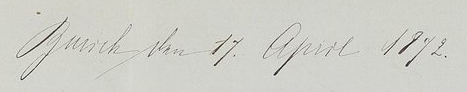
Zürich den 17. April 1872.
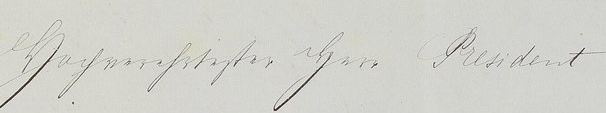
Hochverehrtester Herr President
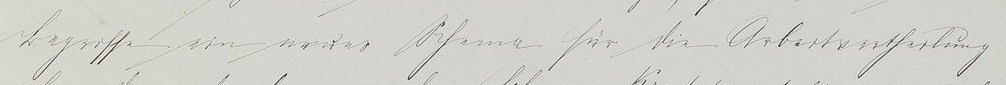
Begriffe ein neues Schema für die Arbeitvertheilung
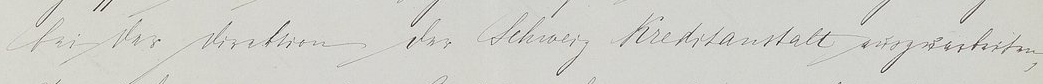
bei der Direktion der Schweiz Kreditanstalt auszuarbeiten,
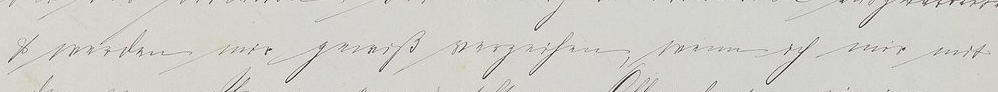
& werden mir gewiß verzeihen, wenn ich mir mit
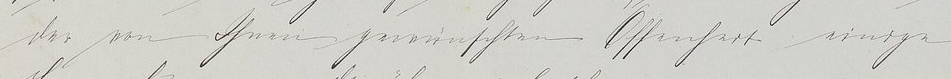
der von Ihnen gewünschten Offenheit einige
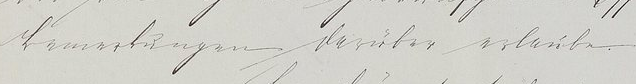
Bemerkungen darüber erlaube.
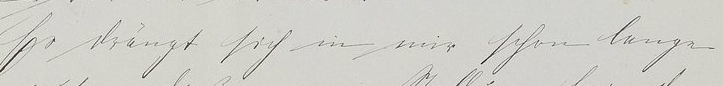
Es drängt sich in mir schon lange
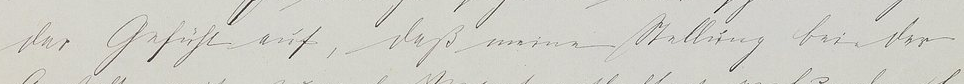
das Gefühl auf, daß meine Stellung bei der
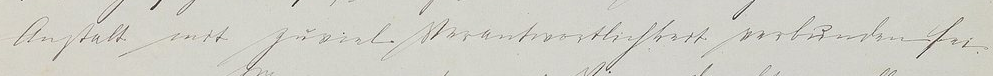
Anstalt mit zuviel Verantwortlichkeit verbunden sei.
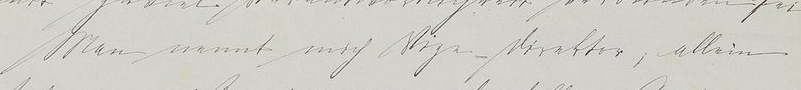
Man nennt mich Vize-Direktor, allein
